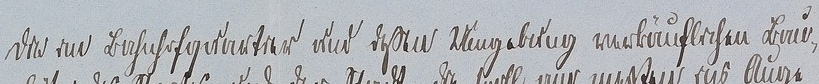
Die im Bahnhofquartier und dessen Umgebung verkäuflichen Bau-
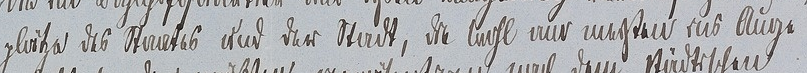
plätze des Staates und der Stadt, die wohl am meisten ins Auge
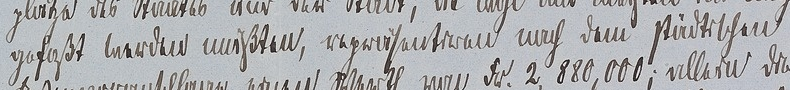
gefaßt werden müßten, repräsentiren nach dem städtischen
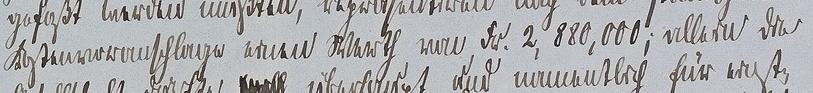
Kostenvoranschlage einen Werth von Fr. 2,880,000; allein die
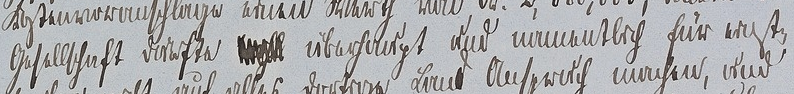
Gesellschaft dürfte ... überhaupt und namentlich für einst-
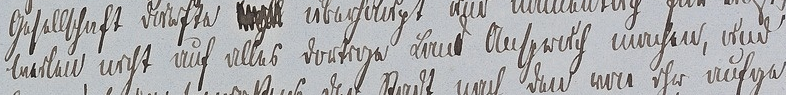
weilen nicht auf alles dortige Land Anspruch machen, und
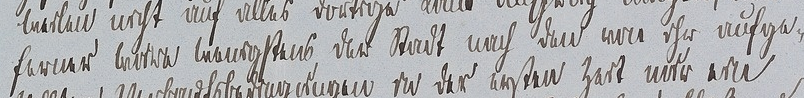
ferner wäre wenigstens der Stadt nach den von ihr aufge-
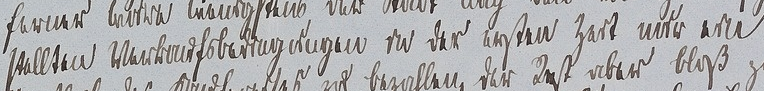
stellten Verkaufsbedingungen in der ersten Zeit nur ein
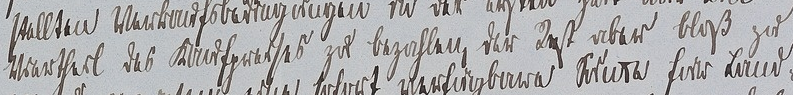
Viertheil des Kaufpreises zu bezahlen, der Rest aber bloß zu
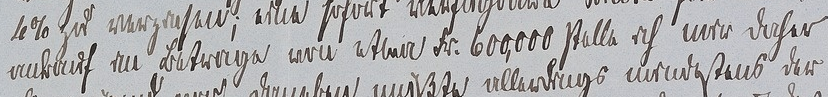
ankauf im Betrage von etwa Fr. 600,000 stelle ich mir daher
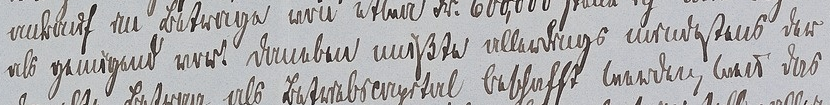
als genügend vor. Daneben müßte allerdings mindestens der
